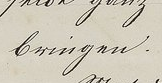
bringen.
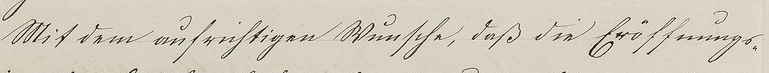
Mit dem aufrichtigen Wunsche, daß die Eröffnungs-
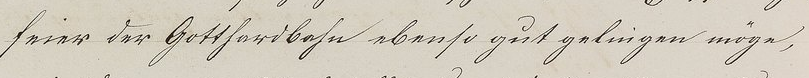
feier der Gotthardbahn ebenso gut gelingen möge,
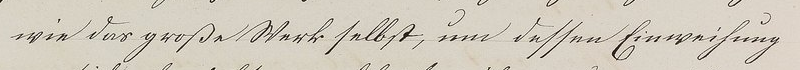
wie das große Werk selbst, um dessen Einweihung
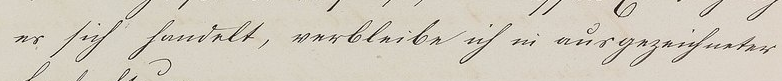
es sich handelt, verbleibe ich in ausgezeichneter
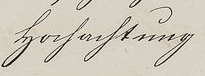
Hochachtung
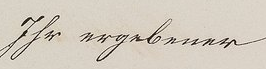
Ihr ergebener
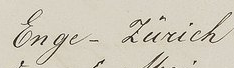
Enge-Zürich
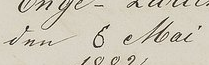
den 6 Mai
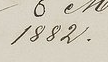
1882.
